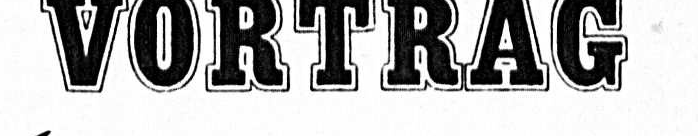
Vortrag
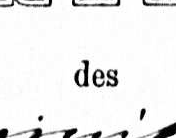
des
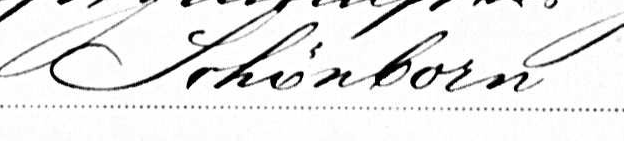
Schönborn
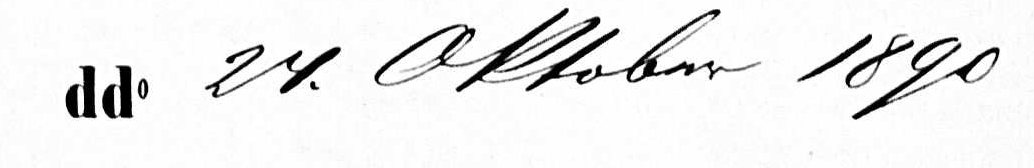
ddo 24. Oktober 1890
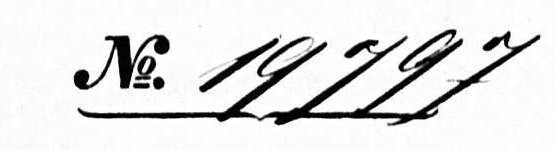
No. 19797
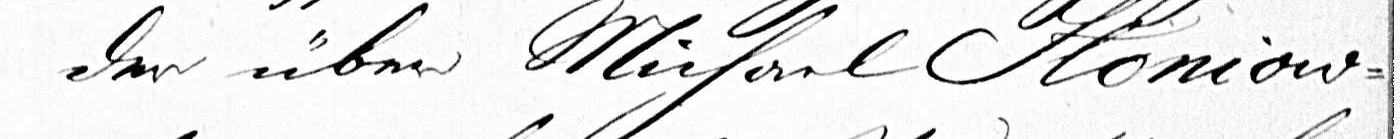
der über Michael Honiow¬
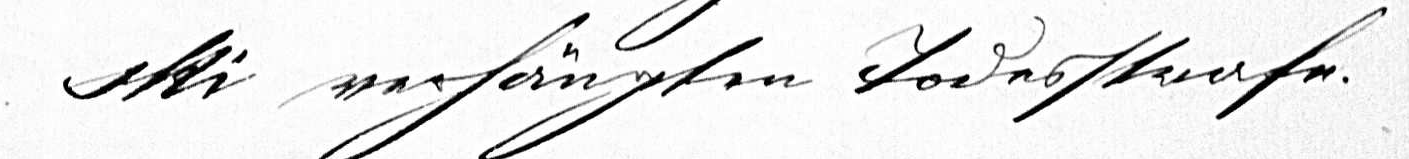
ski verhängten Todesstrafe.
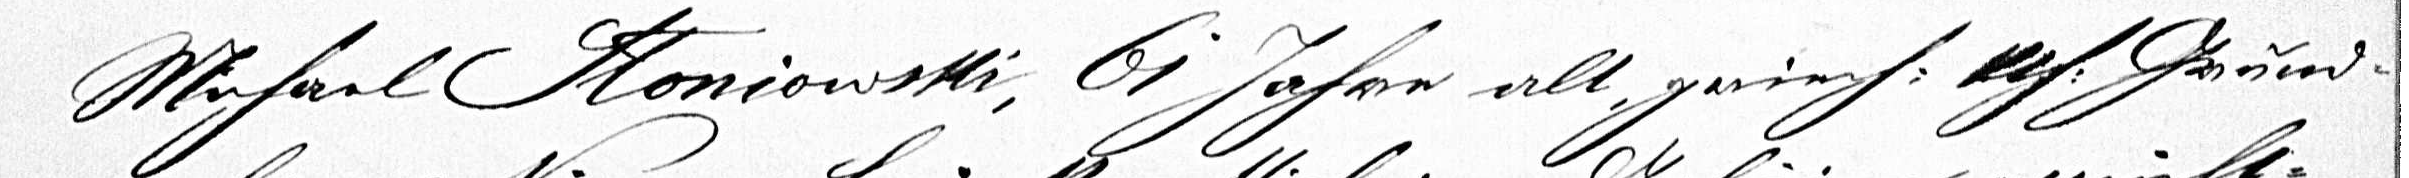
Michael Stoniowski, 61 Jahre alt, griech: kth: Grund¬
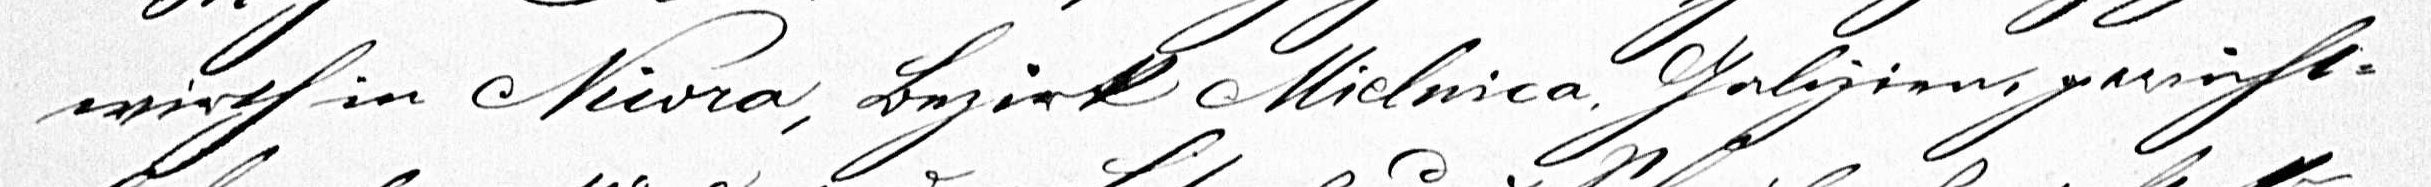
wirth in Niwra, Bezirk Mielnica. Galizien, gericht¬
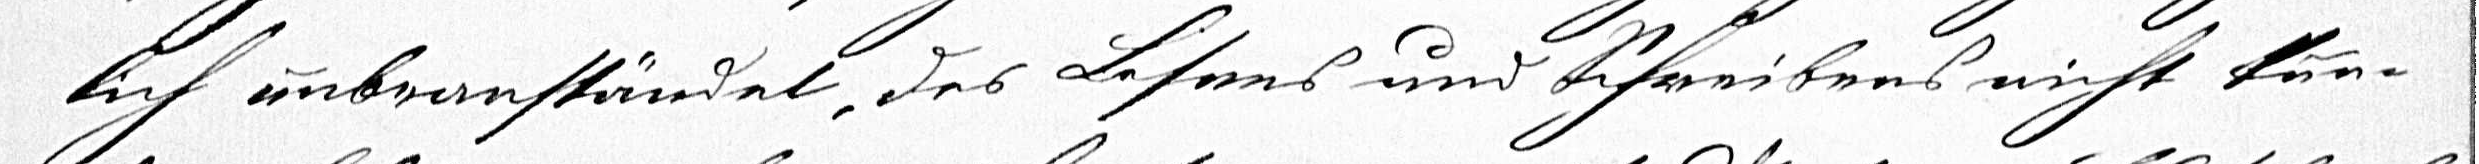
lich unbeanständet, des Lesens und Schreibens nicht kun¬
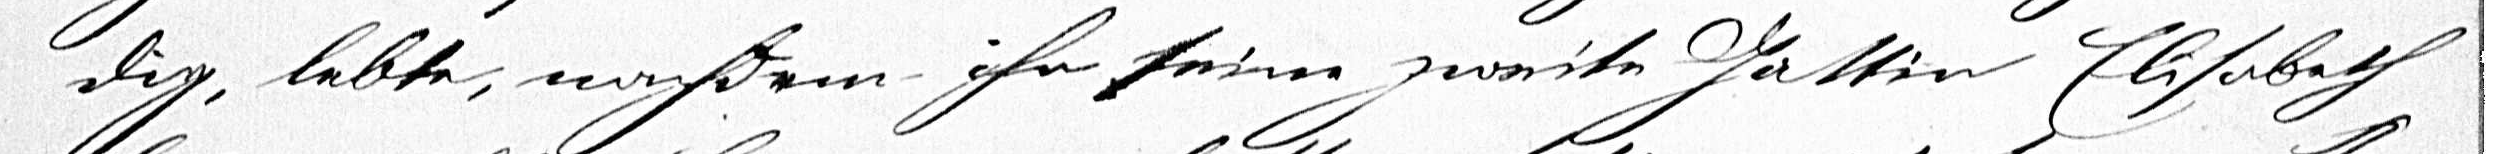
dig, lebte, nachdem ihn seine zweite Gattin Elisabeth
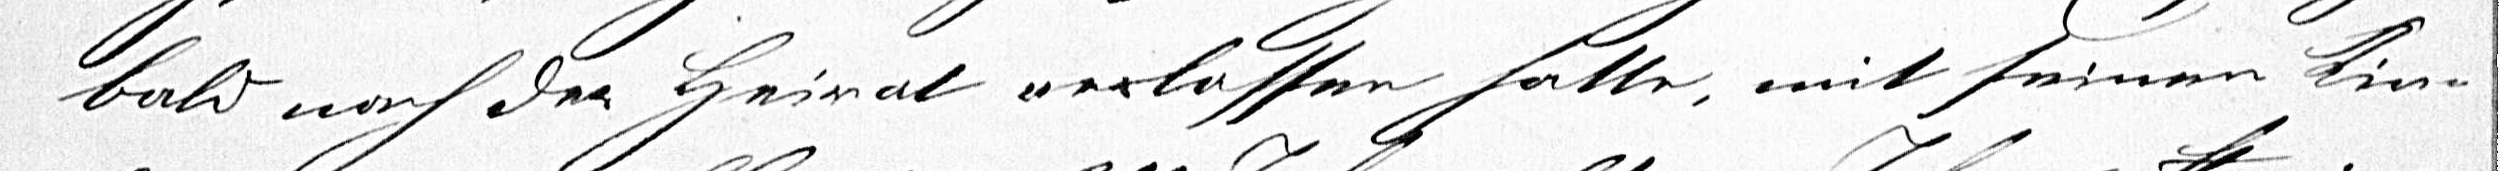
bald nach der Heirat verlassen hatte, mit seinen Kin¬
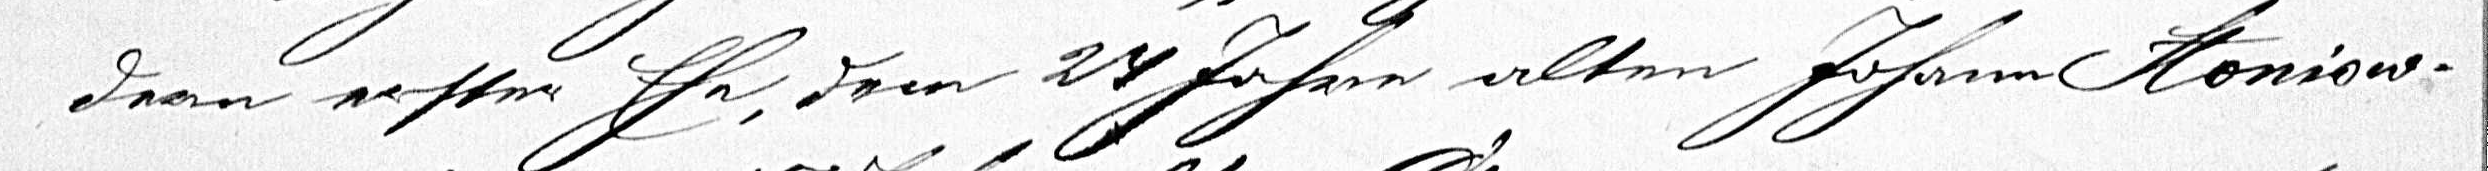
dern erster Ehe, dem 24 Jahre alten Johann Honiow¬
